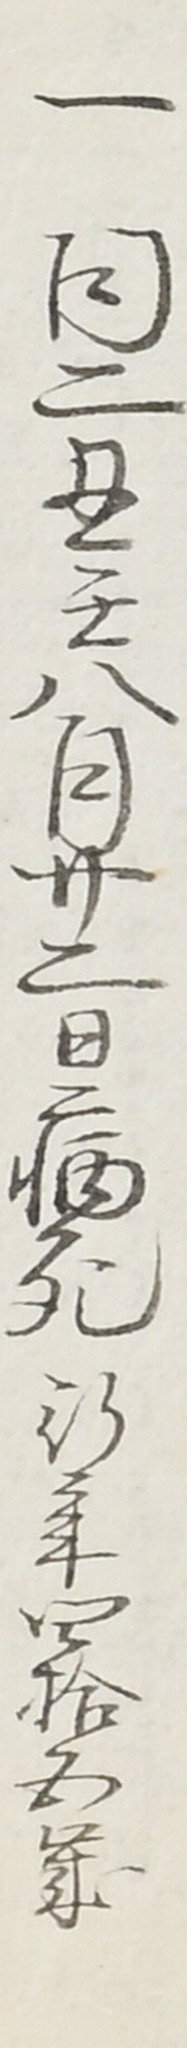一同二丑閏八月廿二日病死行年四拾五歳
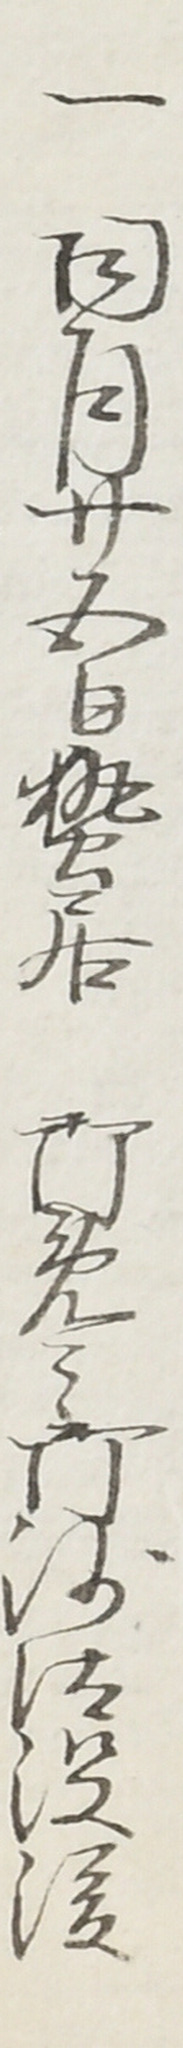一同月廿五日蟄居御免之御沙汰没後
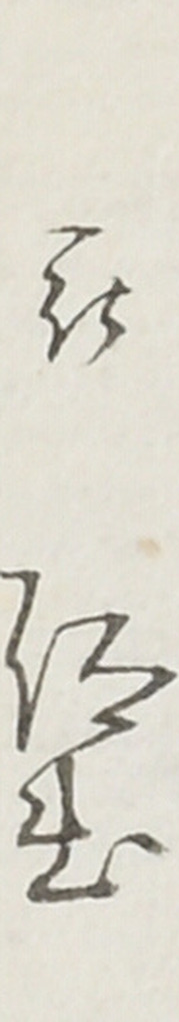被仰出
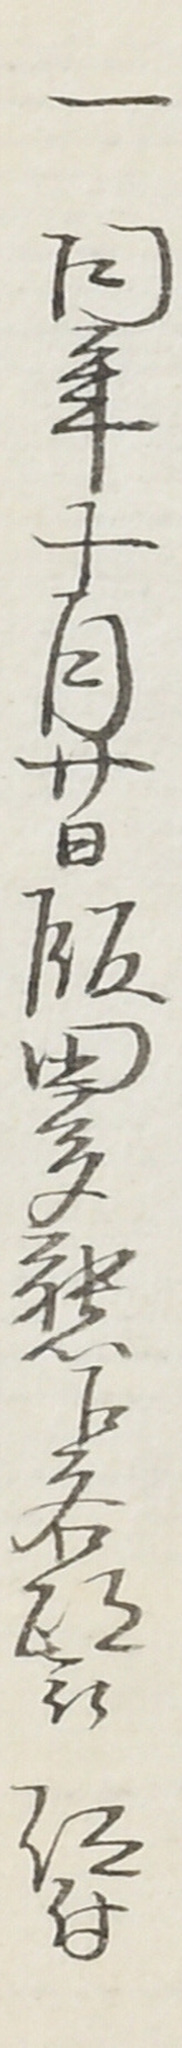一同年十月廿日飯田多熊江名跡被仰付

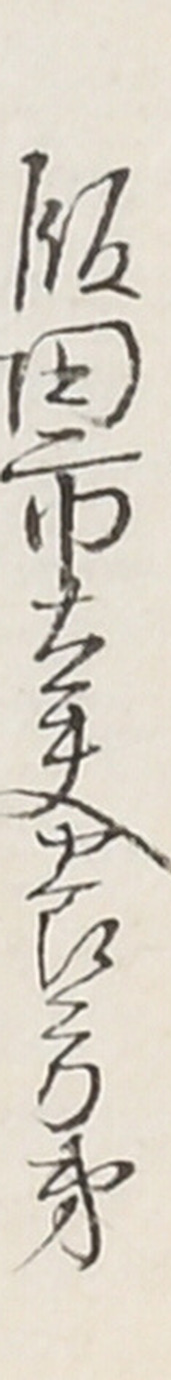飯田市太夫養方弟
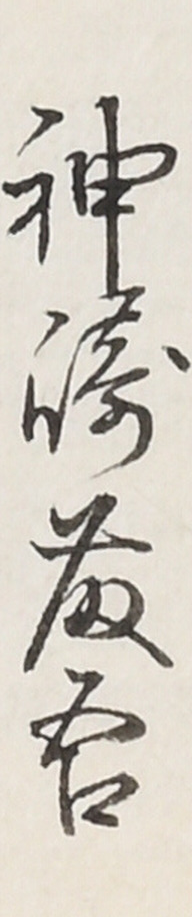神崎藤吾
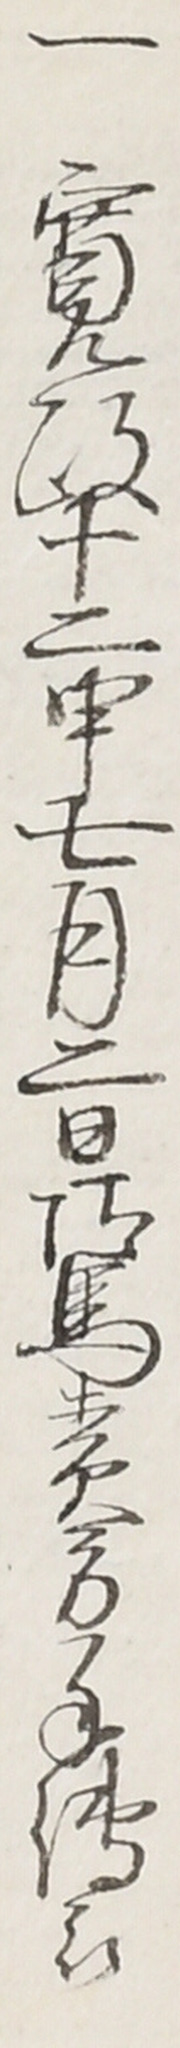一寛政十二申七月二日御馬責方手伝被
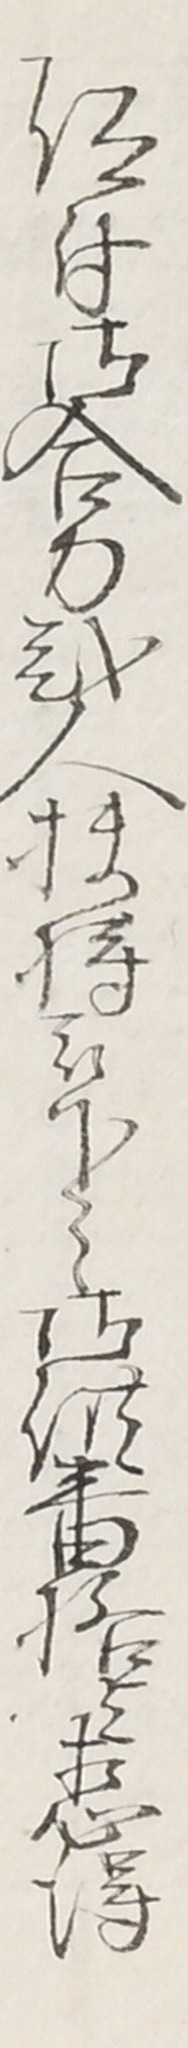仰付御合力弐人扶持被下之御供番格と相心得
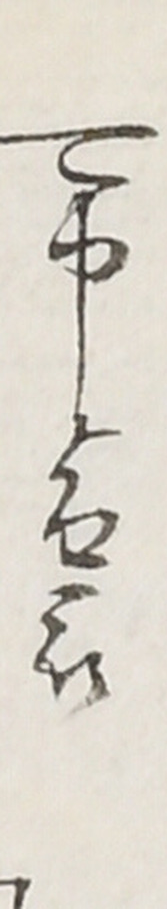可申旨被仰出
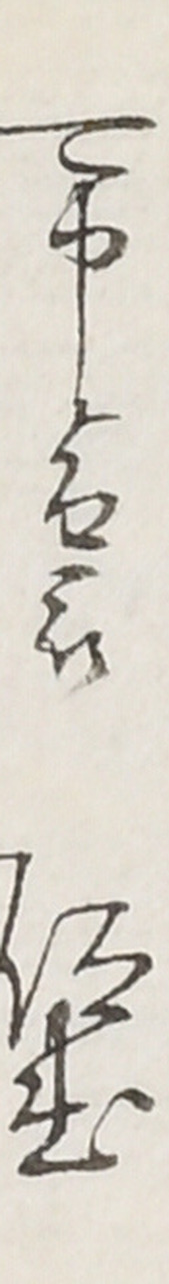可申旨被仰出
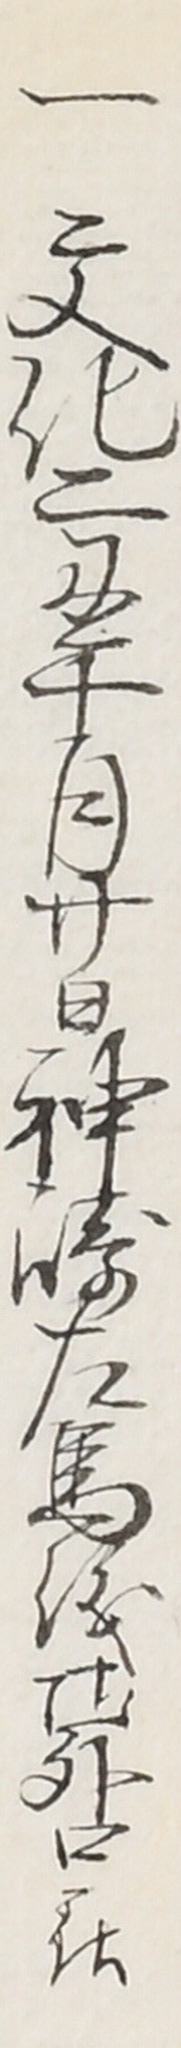一文化二丑十月廿日神崎左馬儀御咎被
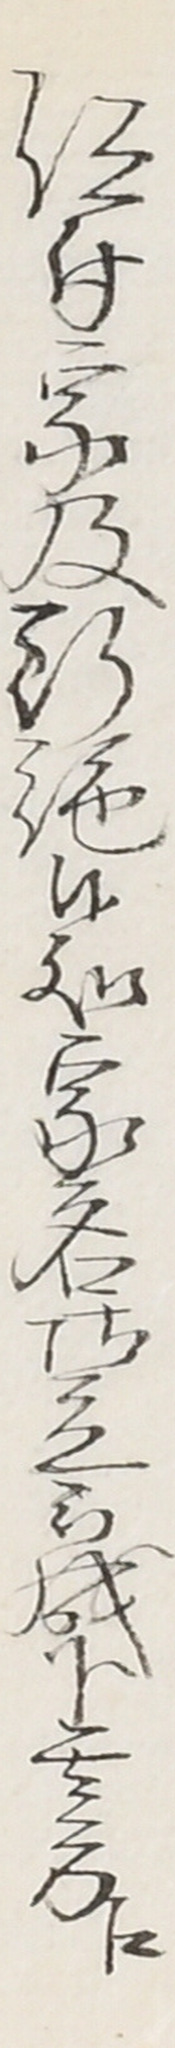仰付家及断絶候処家名御立被成下其方江
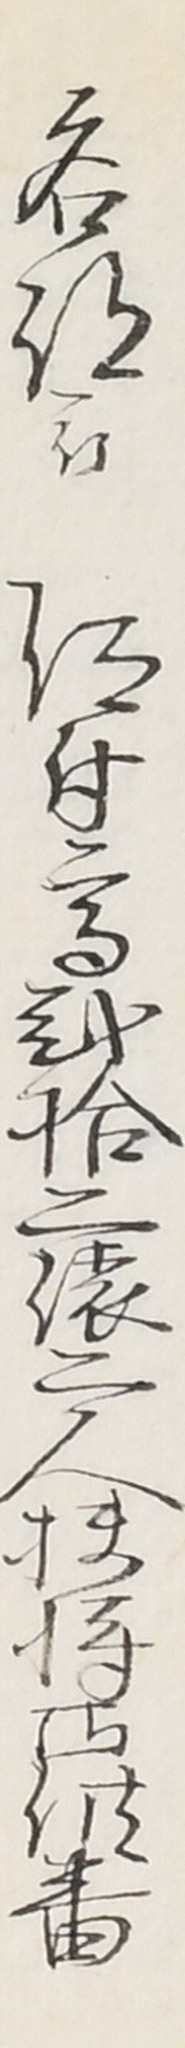名跡被仰付高弐拾二俵二人扶持御供番
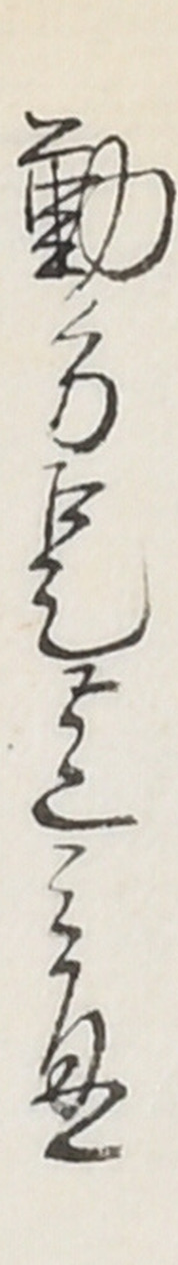勤方是迄之通
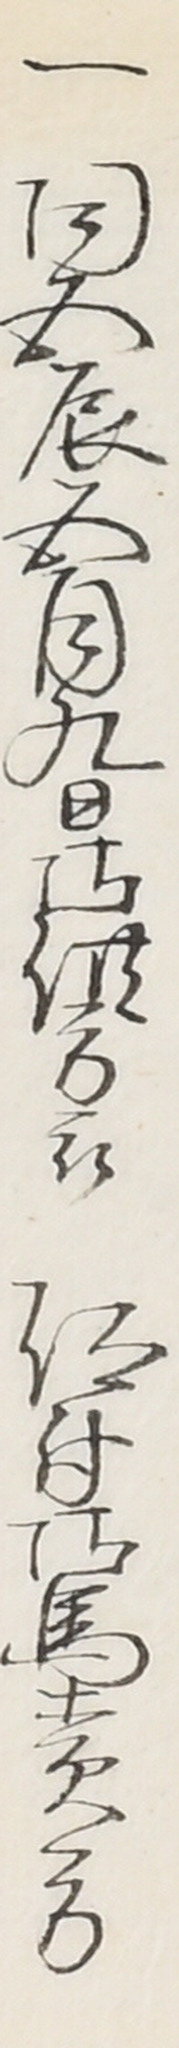一同五辰五月九日御供方被仰付御馬責方
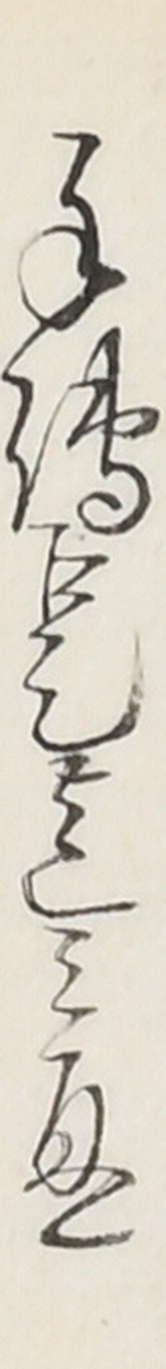手伝是迄之通
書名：給人諸士勤仕録（七）
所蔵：伊那市立高遠町図書館・合同会社AMANE
